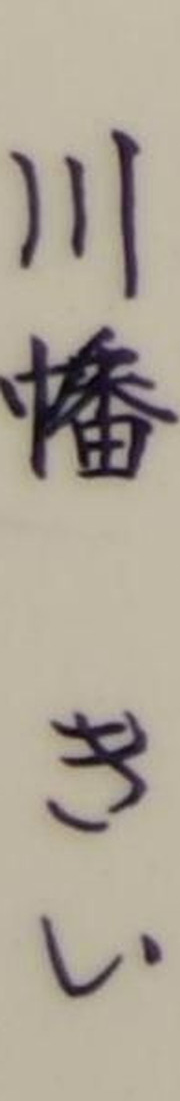川幡きい
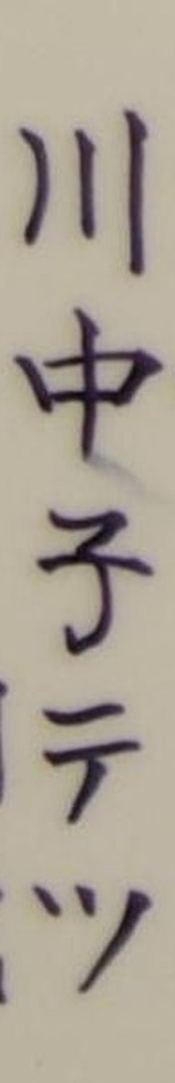川中子テツ

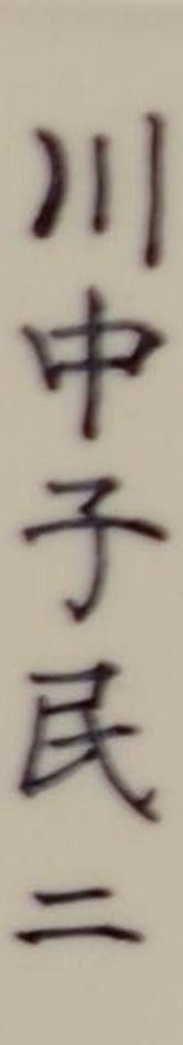川中子民二
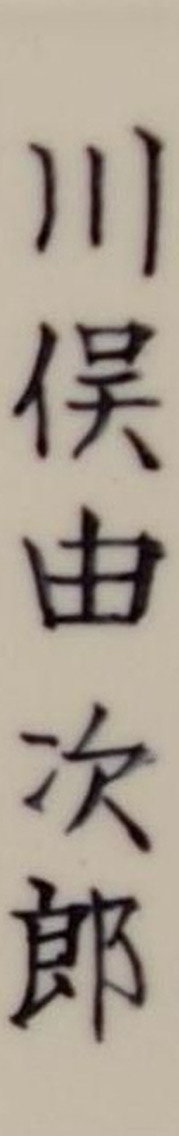川俣由次郎
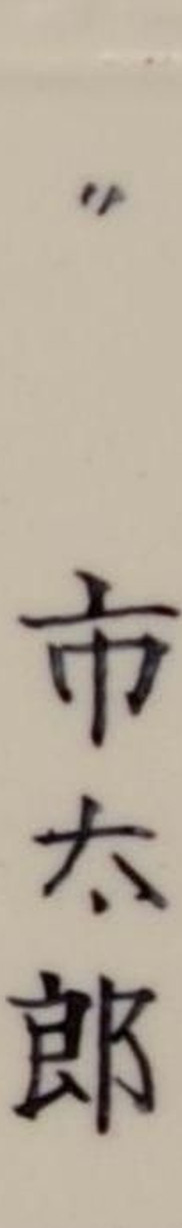市太郎
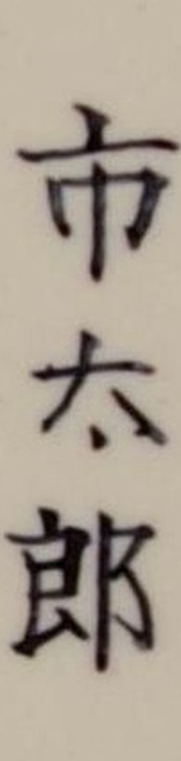市太郎
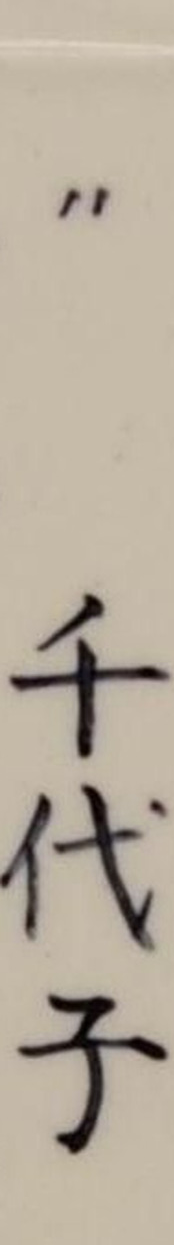千代子
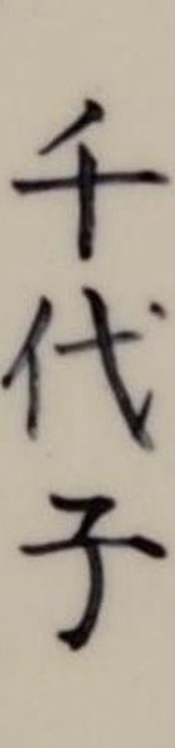千代子
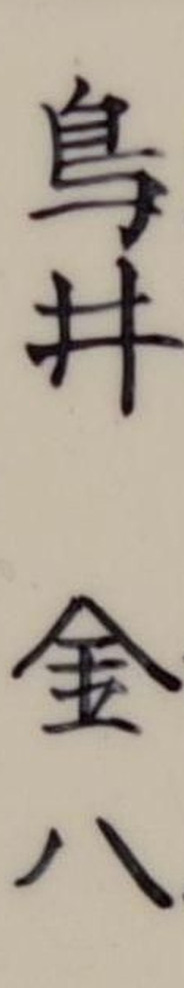鳥井金八
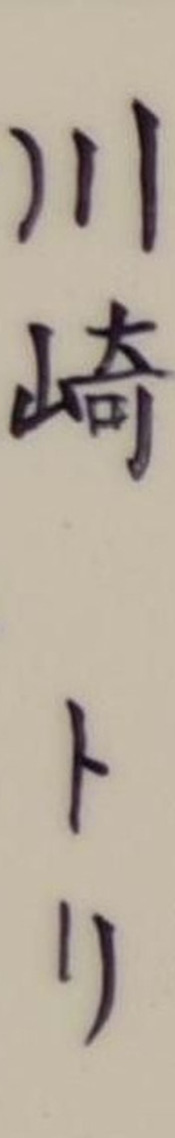川崎トリ
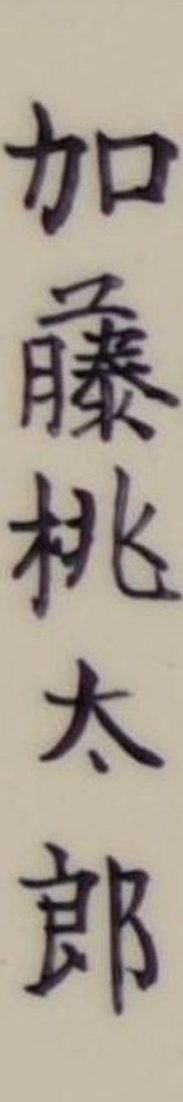加藤桃太郎
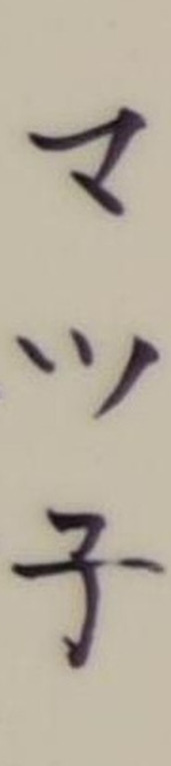マツ子

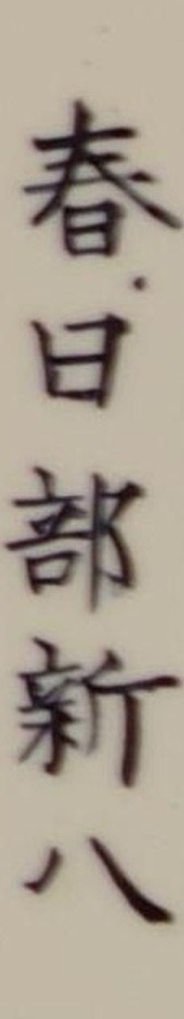春日部新八
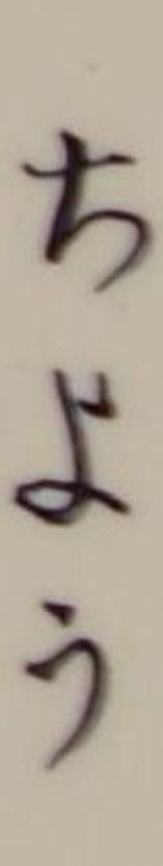ちよう
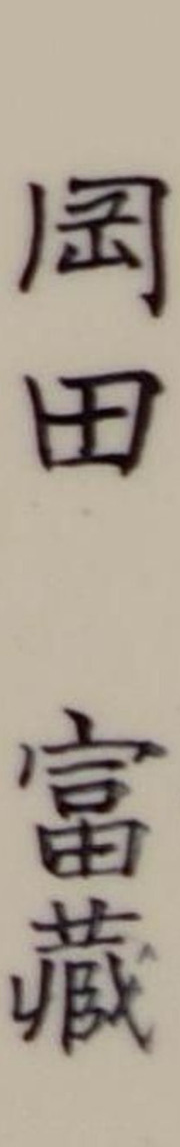岡田富蔵
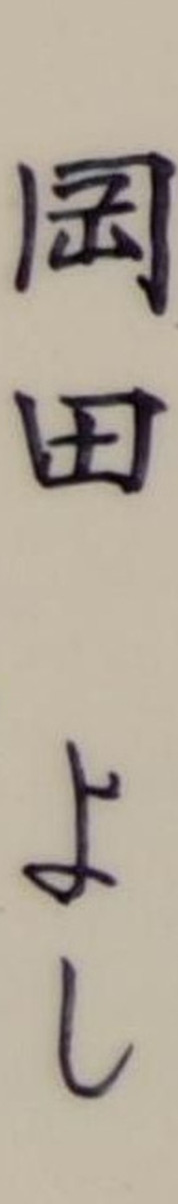岡田よし
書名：M~S
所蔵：高野山金剛峯寺
